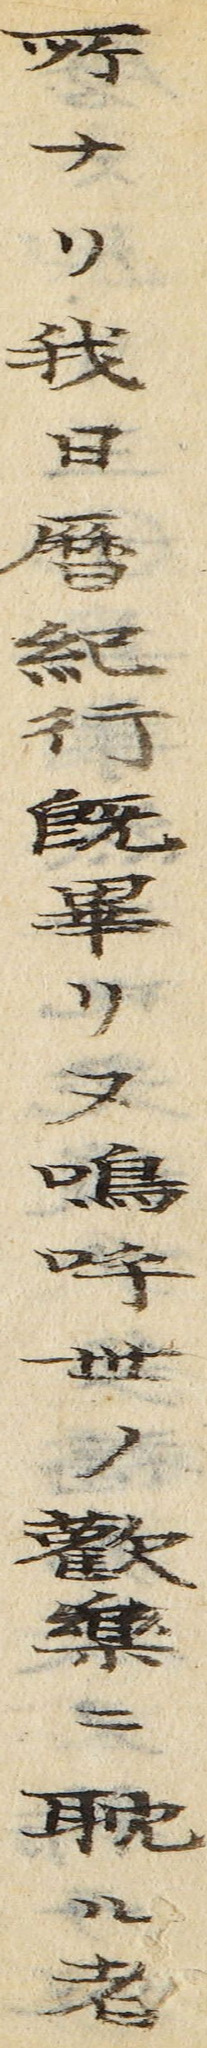所ナリ我日暦紀行既畢リヌ鳴呼世ノ歓楽ニ耽ル者
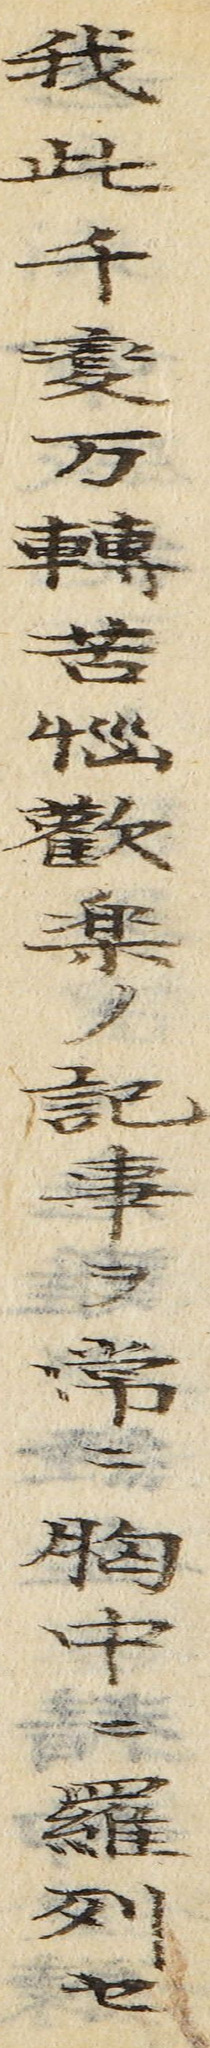我此千変万転苦悩歓楽ノ記事ヲ常ニ胸中ニ羅列セ
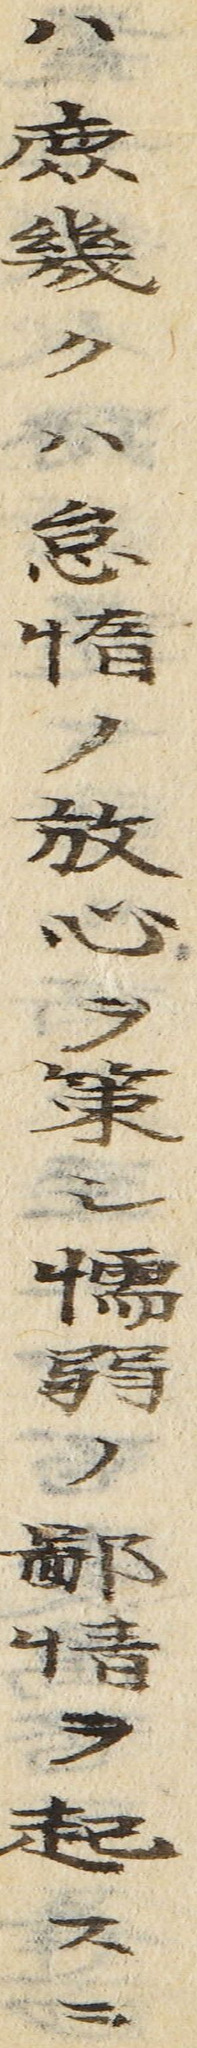ハ庶幾クハ怠惰ノ放心ヲ策シ懦弱ノ鄙情ヲ起スニ
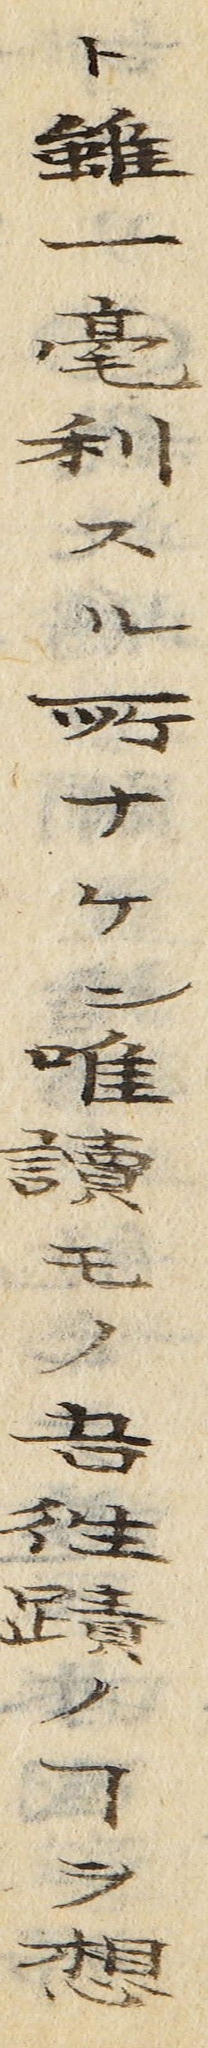ト雖一毫利スル所ナケン唯読モノ吾往蹟ノコトヲ想
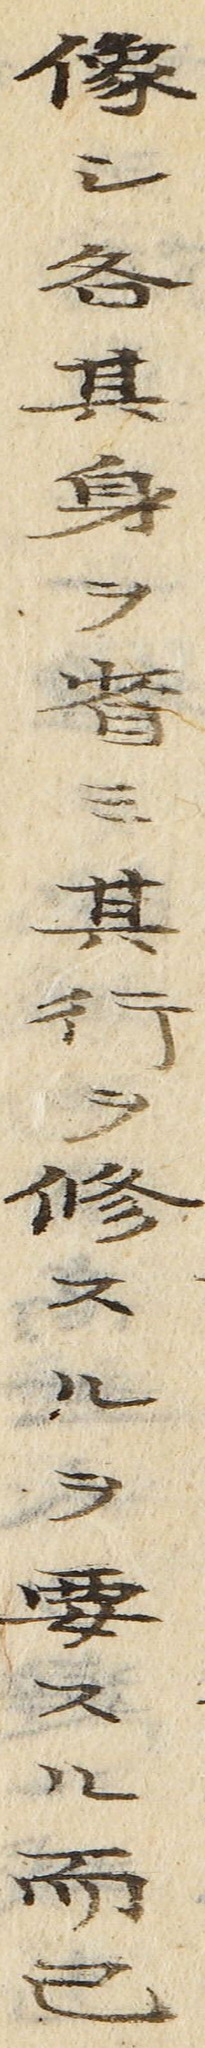像シ各其身ヲ省ミ其行ヲ修スルヲ要スル而已
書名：漂流紀事
